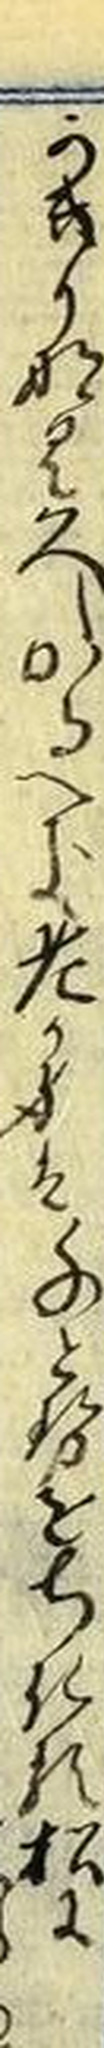かきりなく久しかるへき老か身はちとせもちきる松にくらへむ
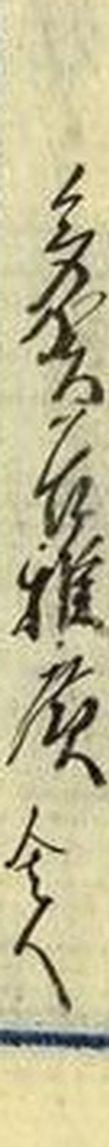多賀谷雅廣舎人
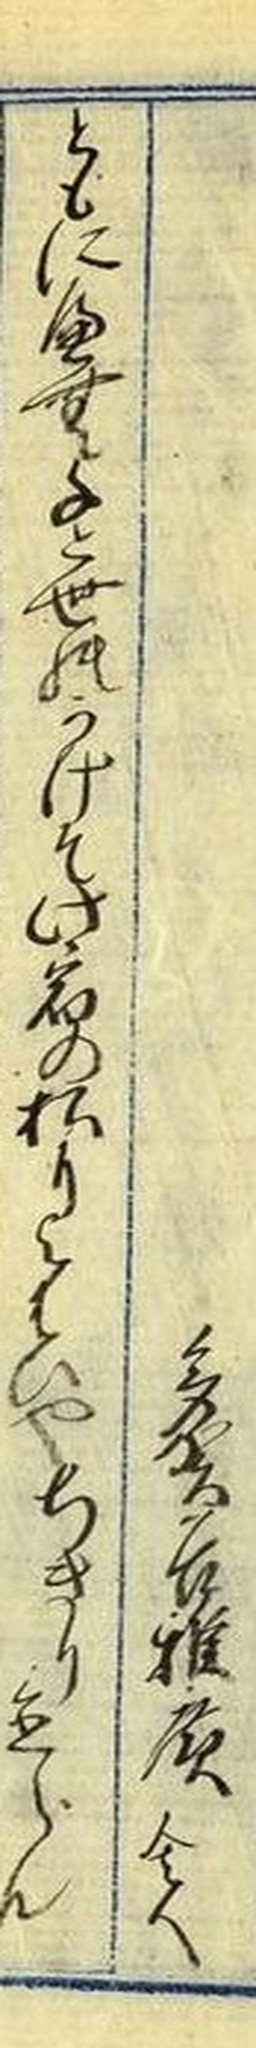ともにへむちとせのかけそ此宿の松によはひやちきり置らん
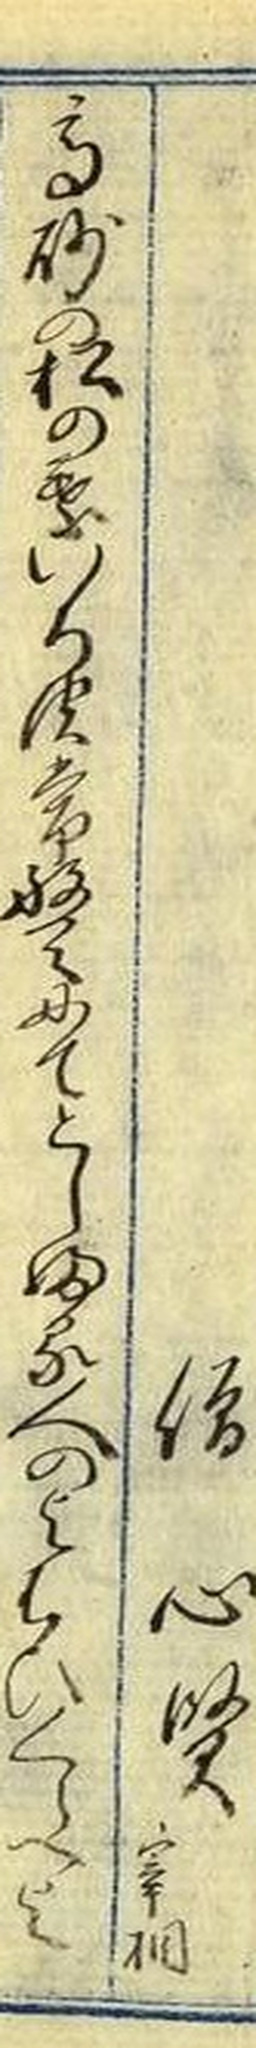高砂の松の葉いろは常盤にてとしふる人のよはひくらへよ
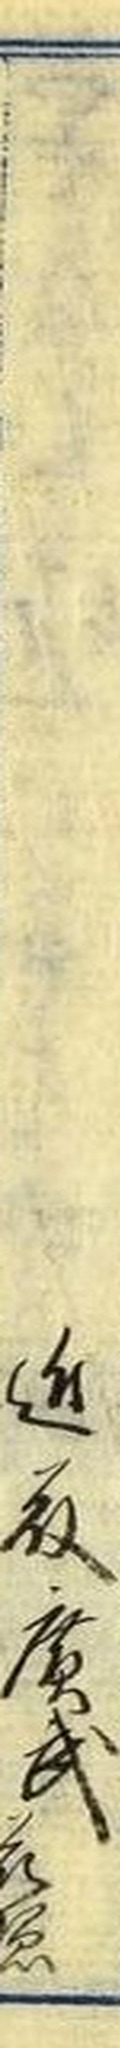近藤廣武花隠
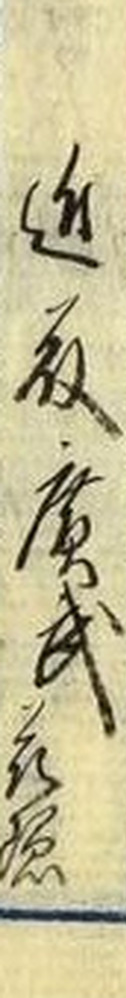近藤廣武花隠
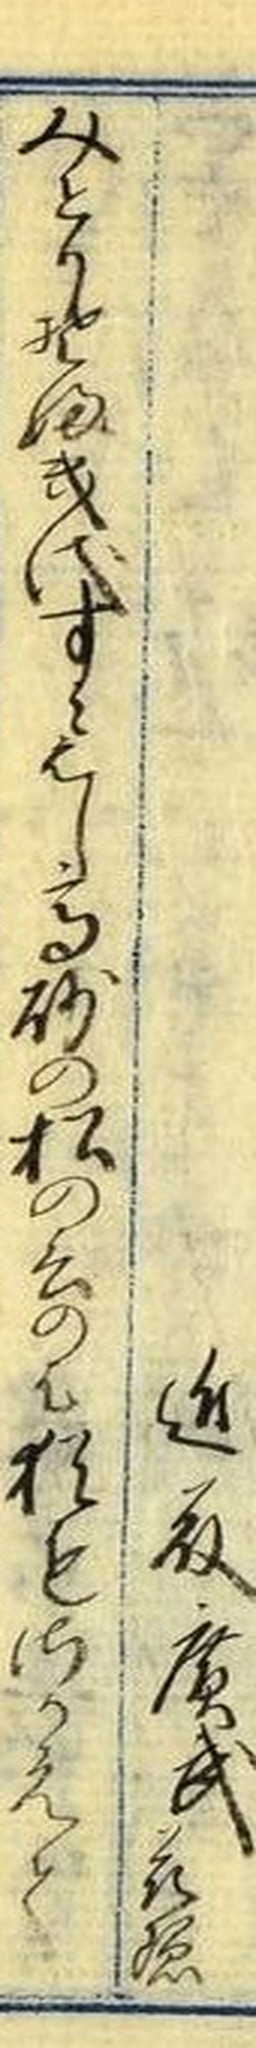みとりそふ幾代すみえし高砂の松の言のは猶もさかえて

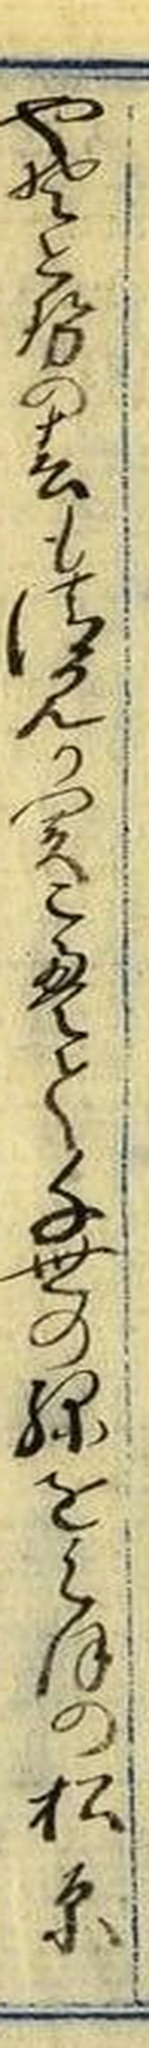やそとせの春も清見か関こゑて千世の緑をみほの松原
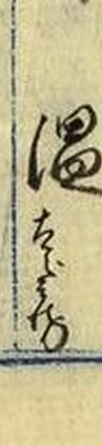多森温太郎兵衛
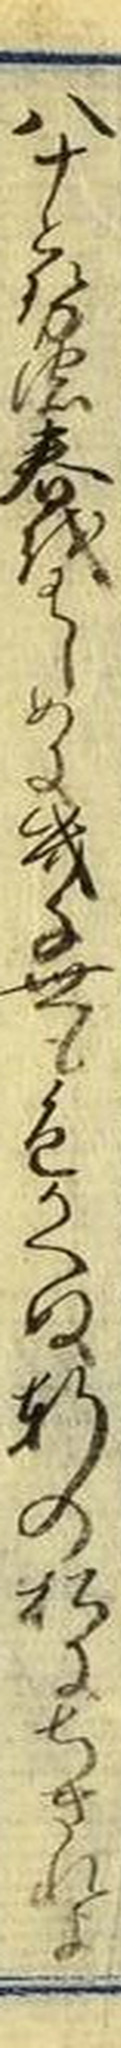八十とせの春をはしめに幾千世も色かへぬ軒の松にちきれよ
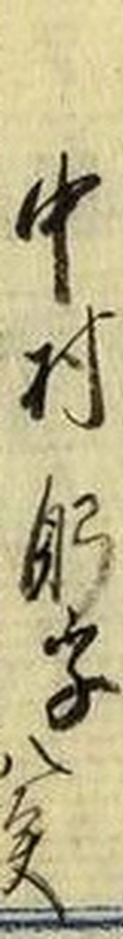中村躬子八太夫
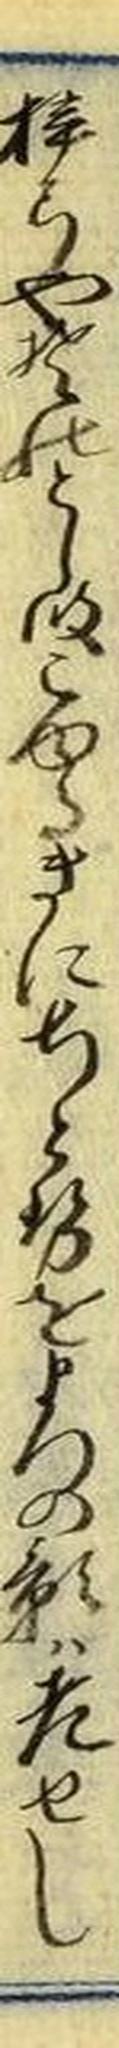梓弓やそのとし波こゆるきにちとせをまつの影は老せし
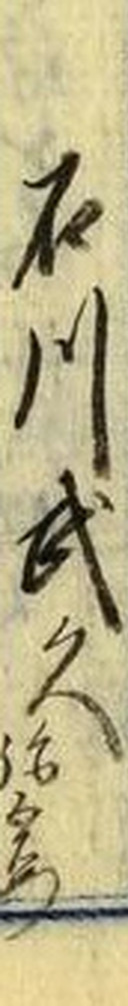石川武久弥五右衛門
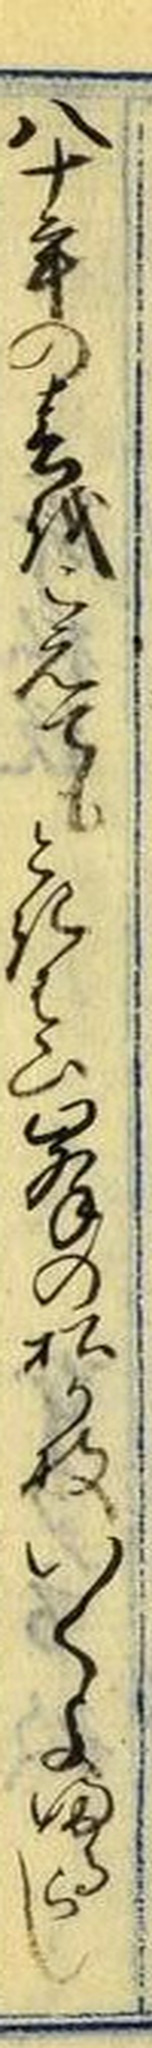八十年の春をこえてもときは山峯の松か枝いくよふるらし
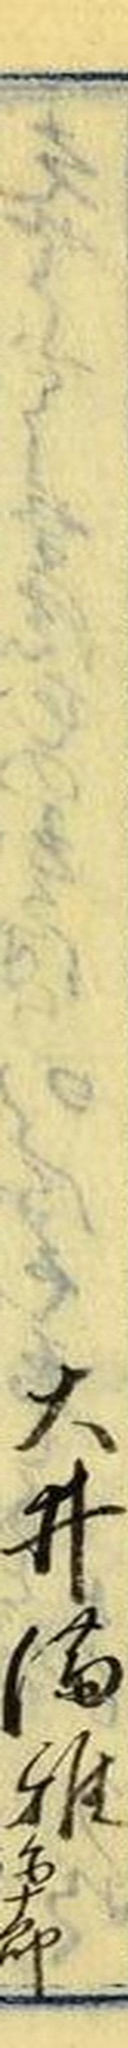大井満雅弥十郎
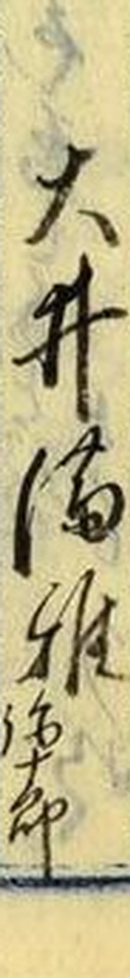大井満雅弥十郎
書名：温古集 三巻
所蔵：福井県文書館 Fukui Prefectural Archives
